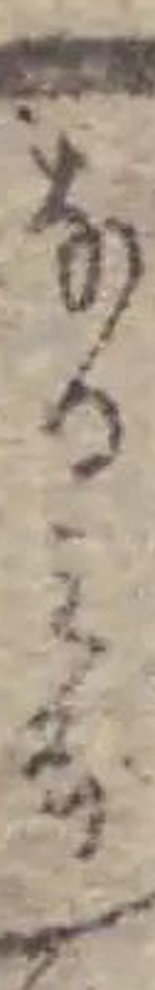なるみな
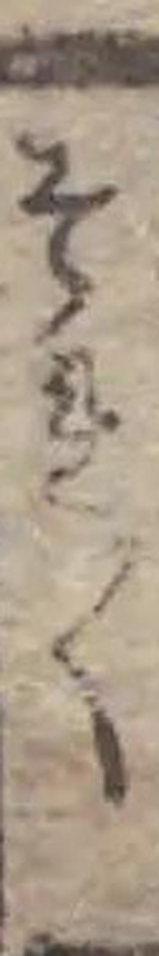それ〳〵
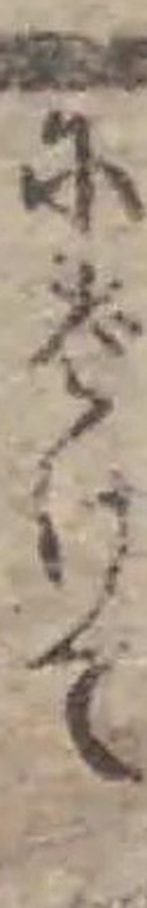にばけて
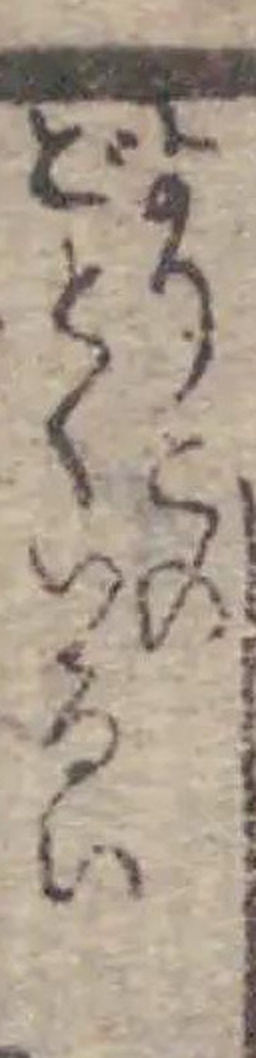ごとくいるい

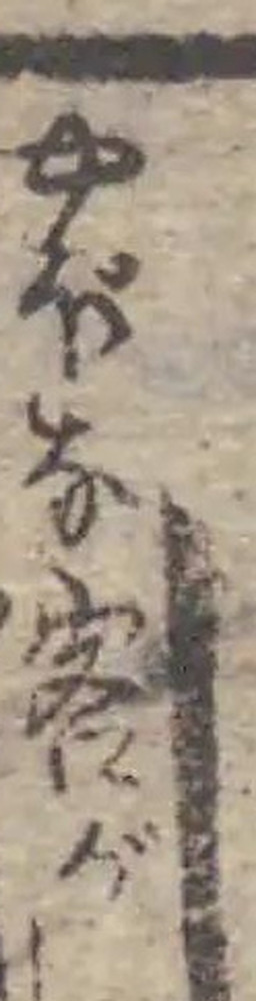やぼな客が
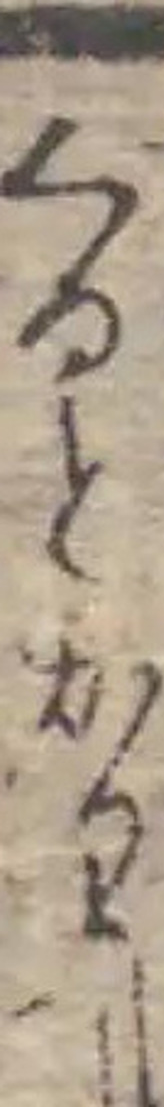くるとかわ
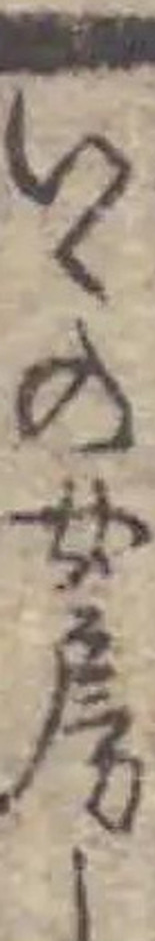いゝの女房
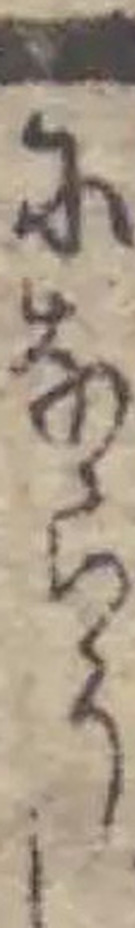にならう
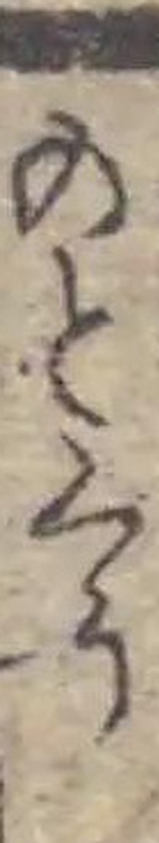のとくう
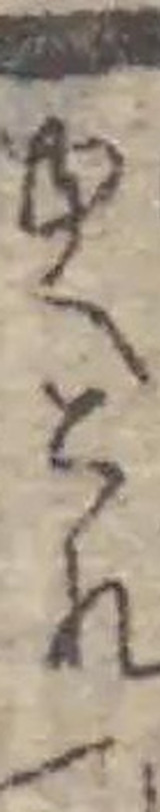ゆへこれ
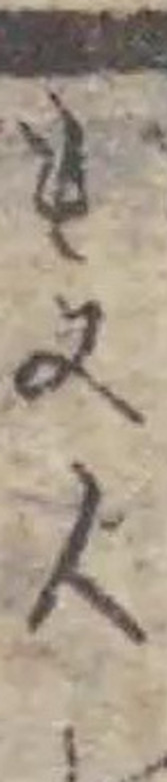も又人
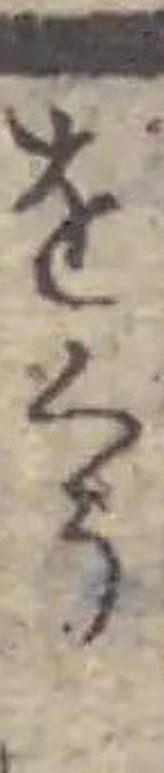をくう
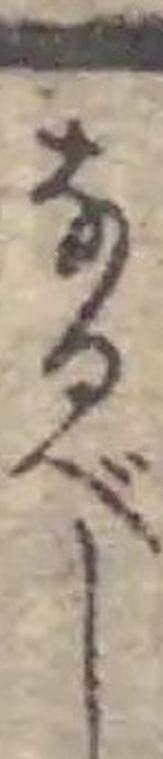なるべし
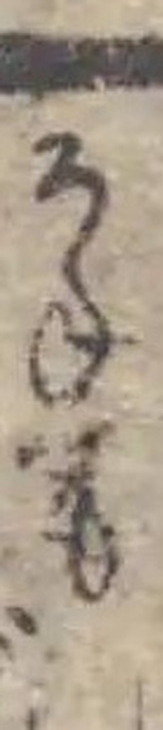かねも
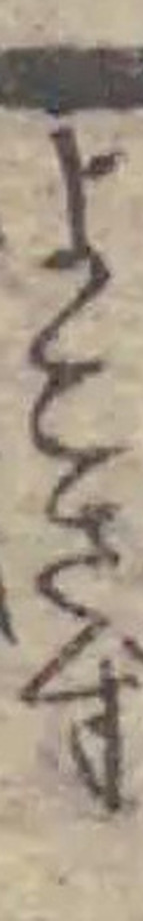よこさず
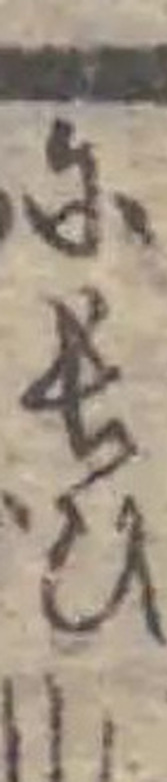に長ひ
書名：作意妖恐懼感心 2巻
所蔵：国立国会図書館 National Diet Library, JAPAN
